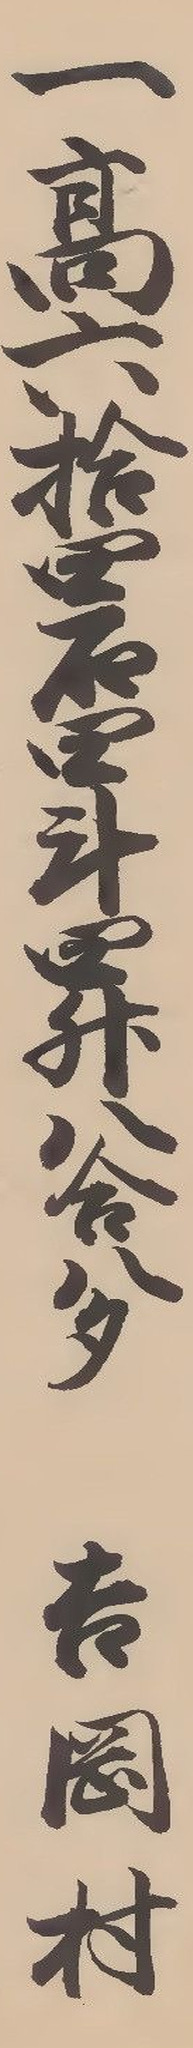一高六拾四石四斗四升八合八勺吉岡村
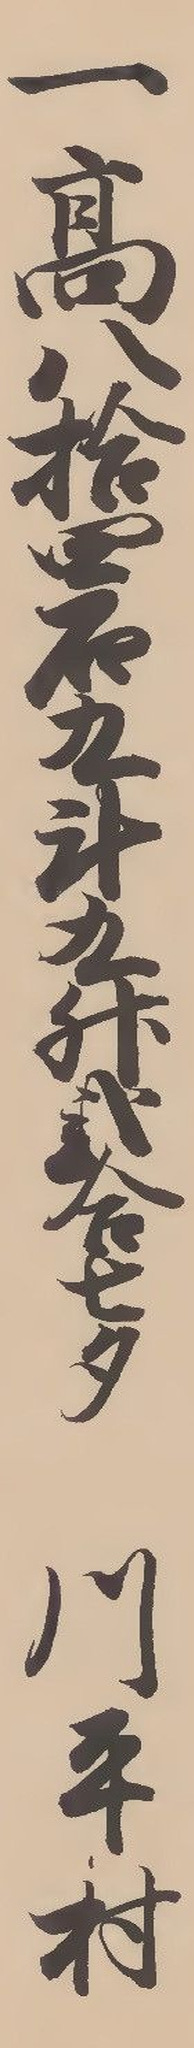一高八拾四石九斗九升弐合七勺川平村
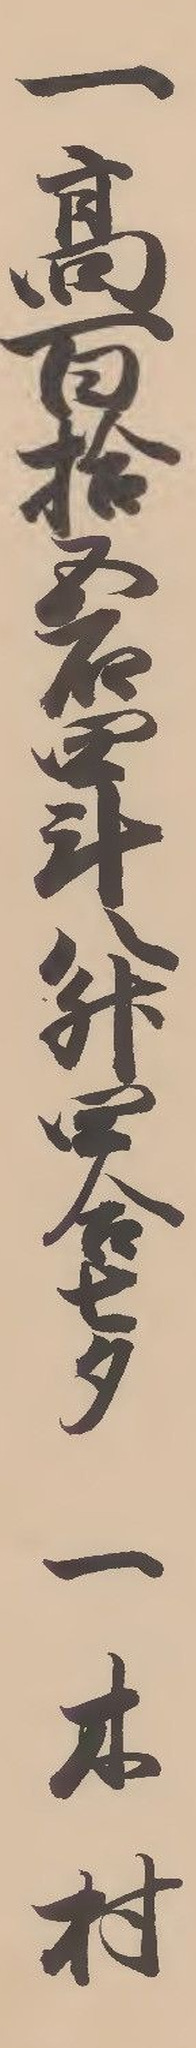一高百拾五石四斗八升四合七勺一木村

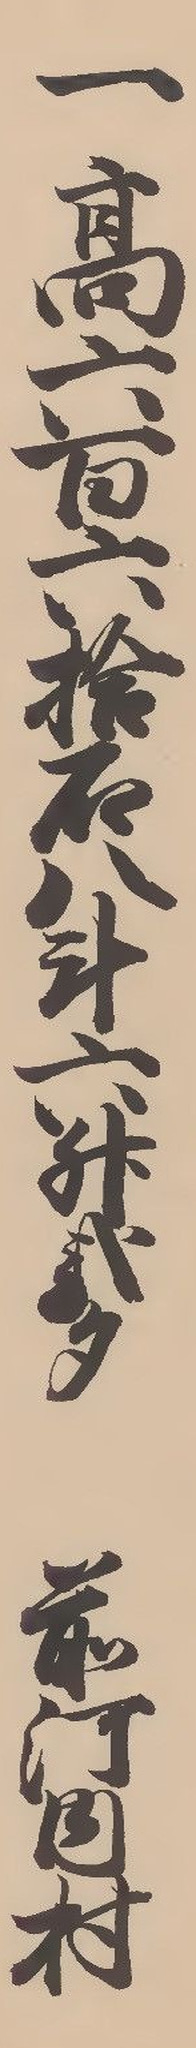一高六百六拾石八斗六升弐勺前河内村
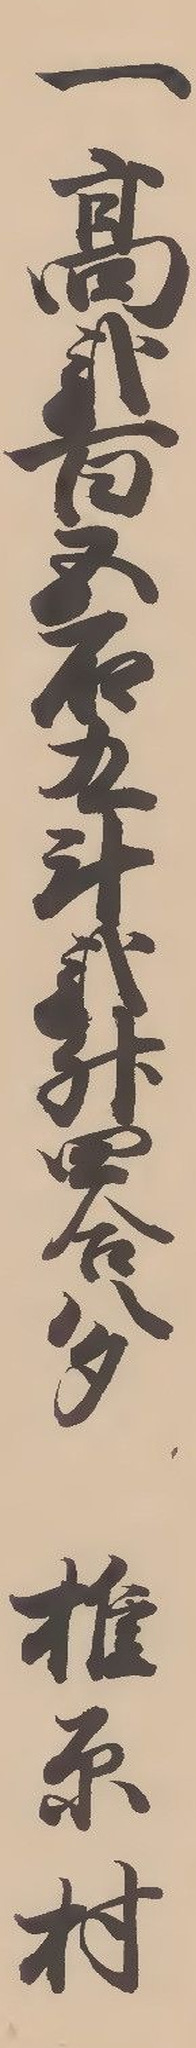一高弐百五石九斗弐升四合八勺椎原村
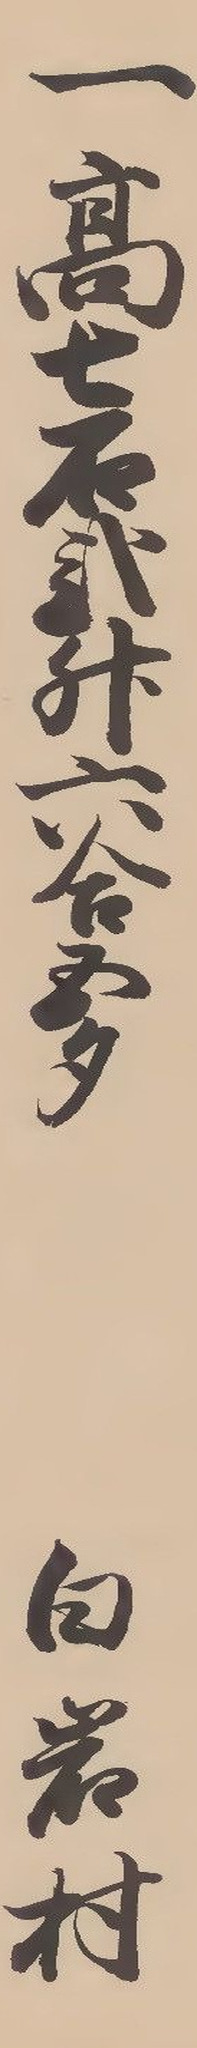一高七石弐升六合五勺白岩村
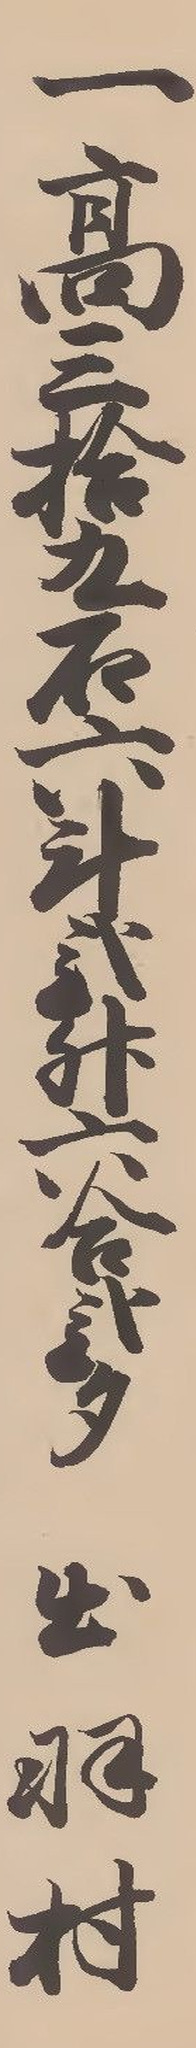一高三拾九石六斗弐升六合弐勺出羽村
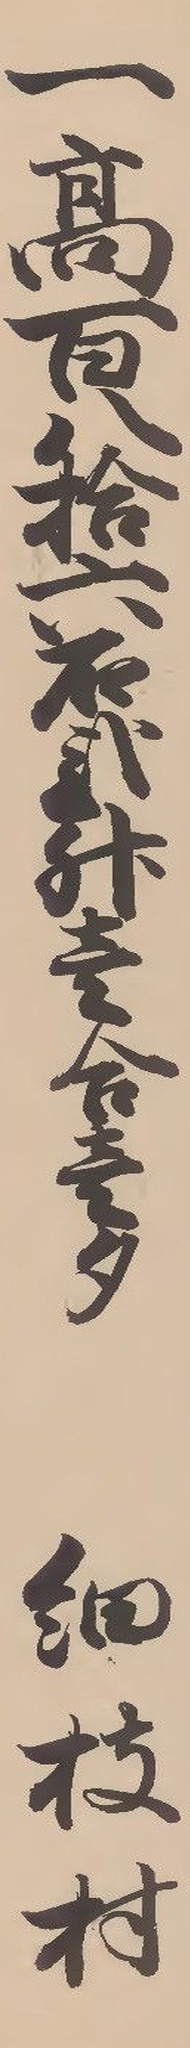一高百八拾六石弐升壱合壱勺細枝村
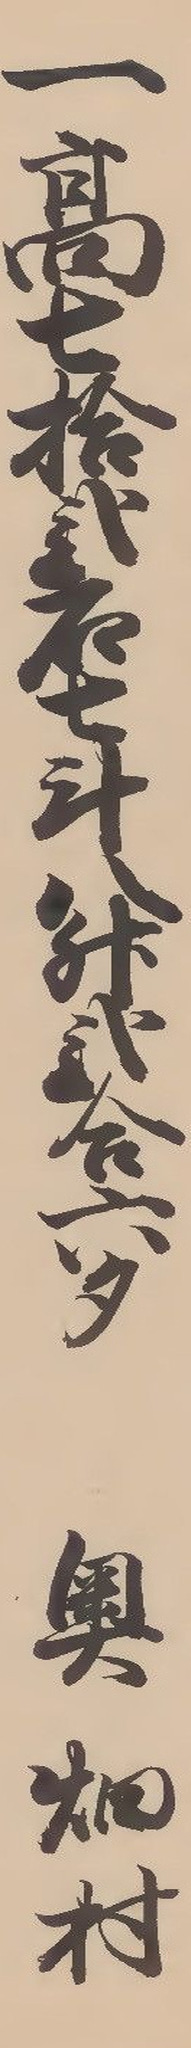一高七拾弐石七斗八升弐合六勺奥畑村
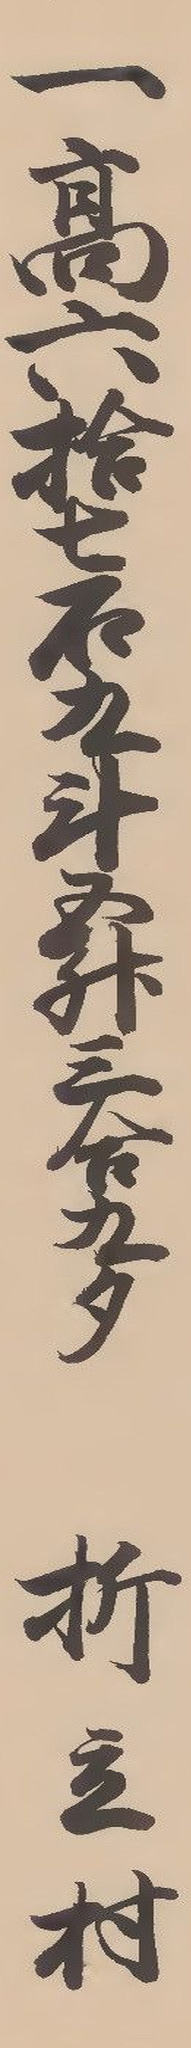一高六拾七石九斗五升三合九勺折立村
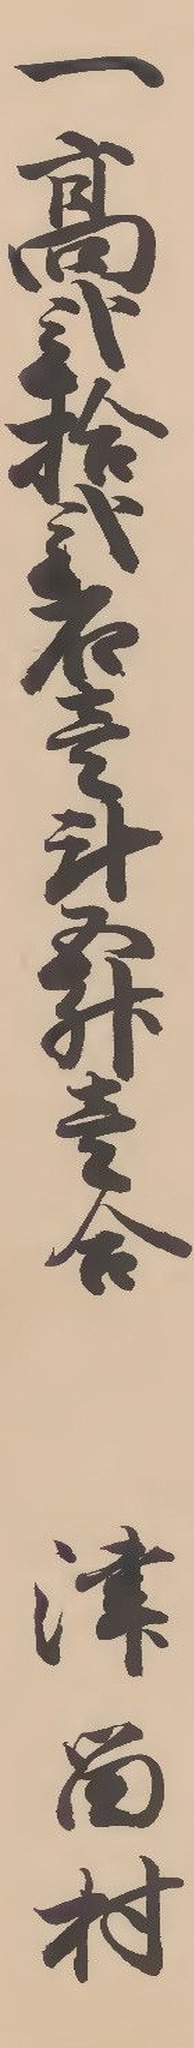一高弐拾弐石壱斗五升壱合津留村

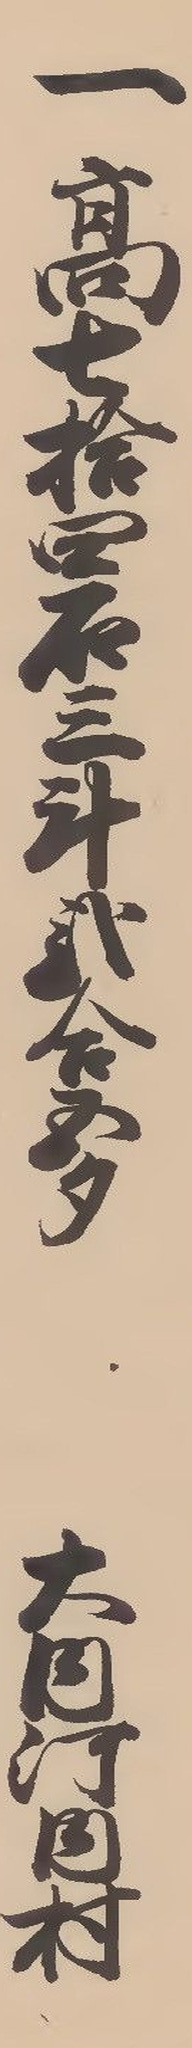一高七拾四石三斗弐合五勺大内河内村
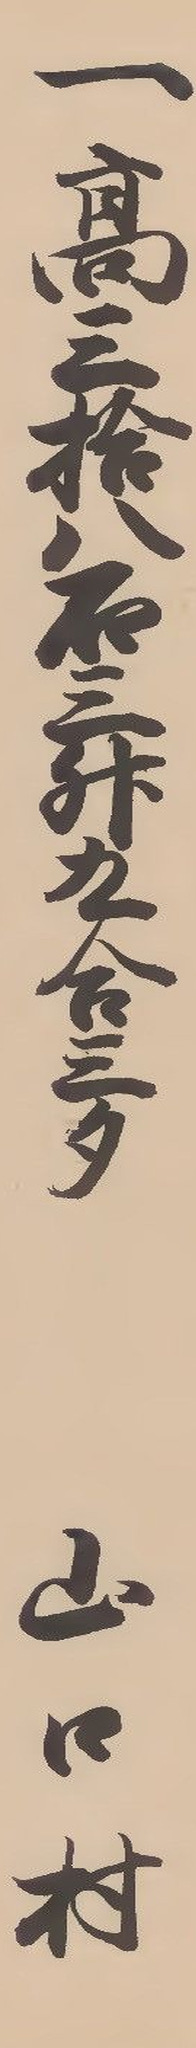一高三拾八石三升九合三勺山口村
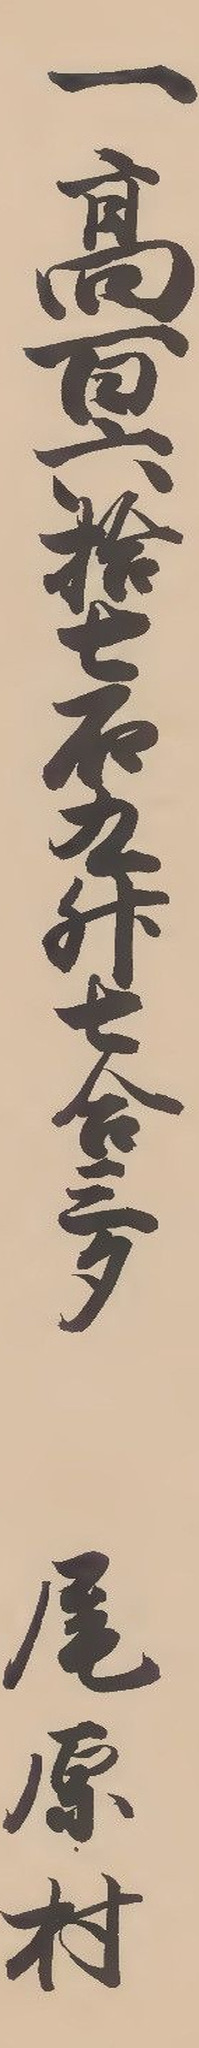一高百六拾七石九升七合三勺尾原村
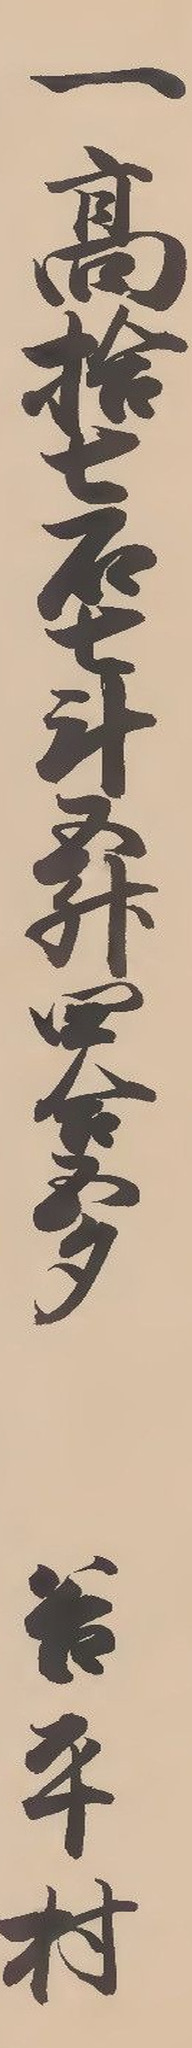一高拾七石七斗五升四合五勺谷平村
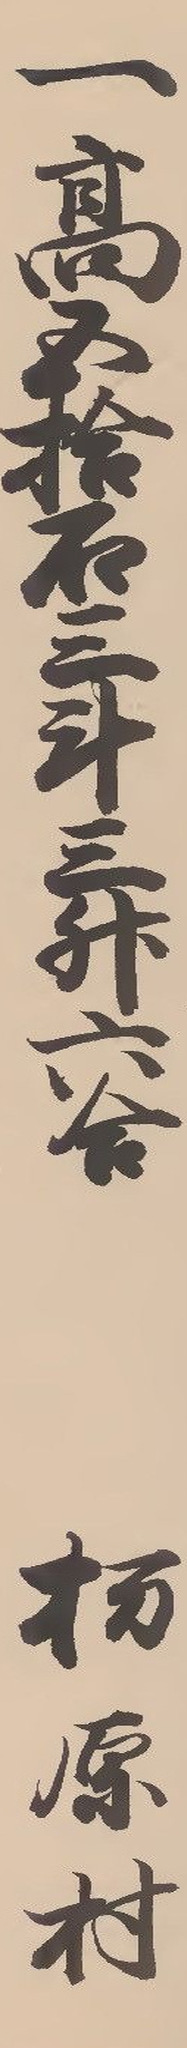一高五拾石三斗三升六合栃原村
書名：豊後国郷帳
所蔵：国立公文書館 National Archives of Japan
